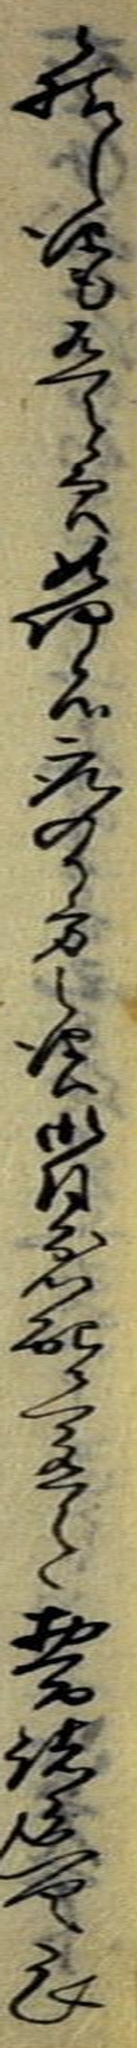候様之儀も有之候而ハ如何ニ候取〆り方之儀ハ御自分心配ニ可有之候惣而諸道具衣
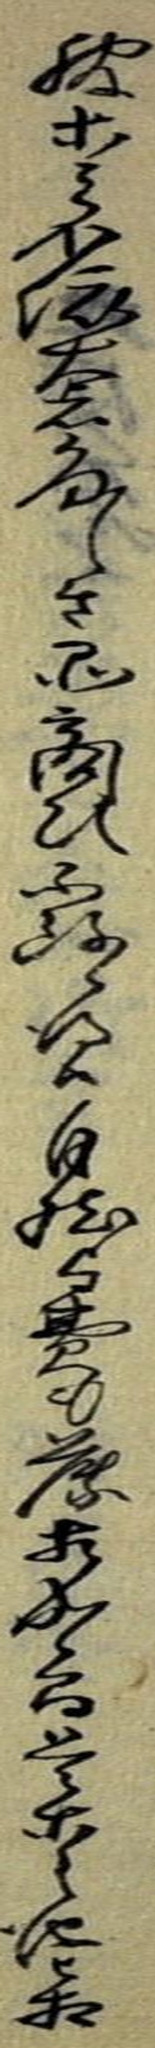服等ニ不依奢かましき品商ひ不致候得ハ自然与費も薄相成候間是等之儀被相
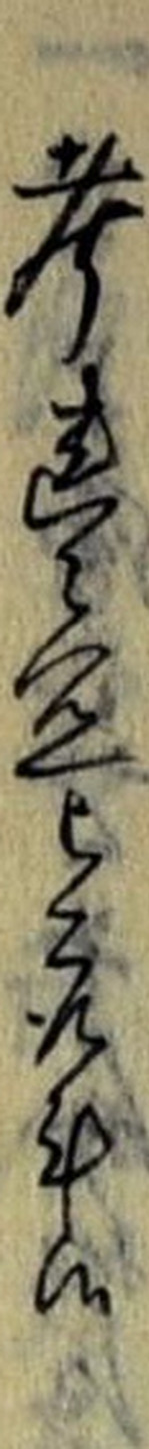考連々宜被取計候
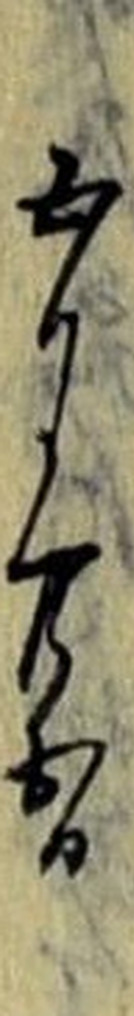五月廿五日
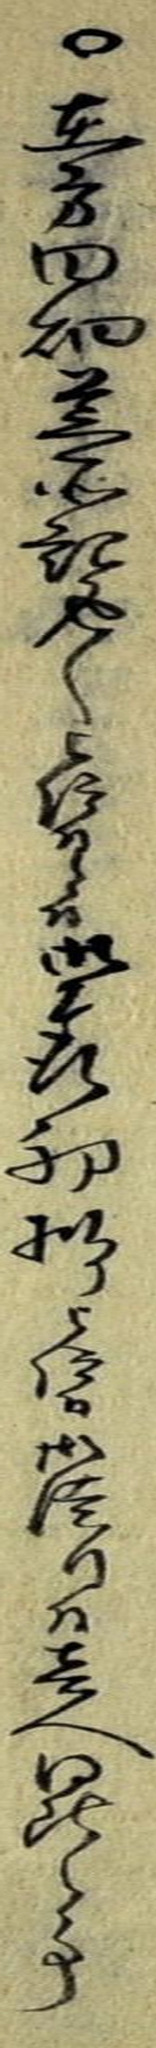〇在方田畑荒所起返し被仰付候ニ付御奉行初掛り被仰付御徒目付壱人同断之事
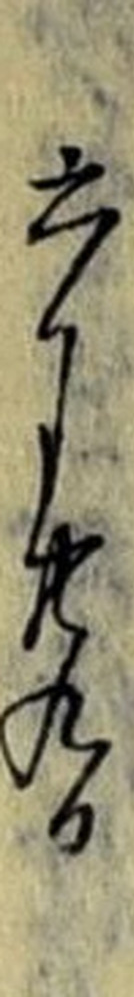六月廿九日
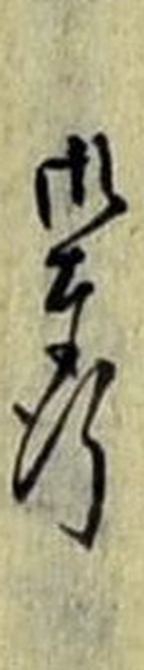御奉行
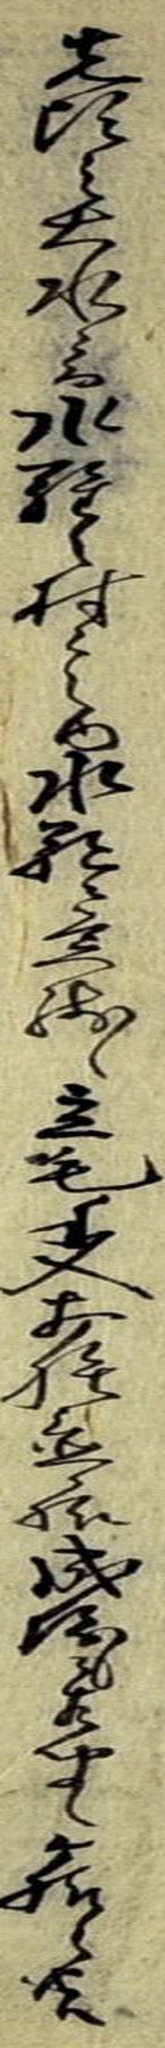〇先頃之大水ニ而水難之村々之内水難ニ実残候立毛手入打捨置候様成儀も相聞候ケ様之儀ハ
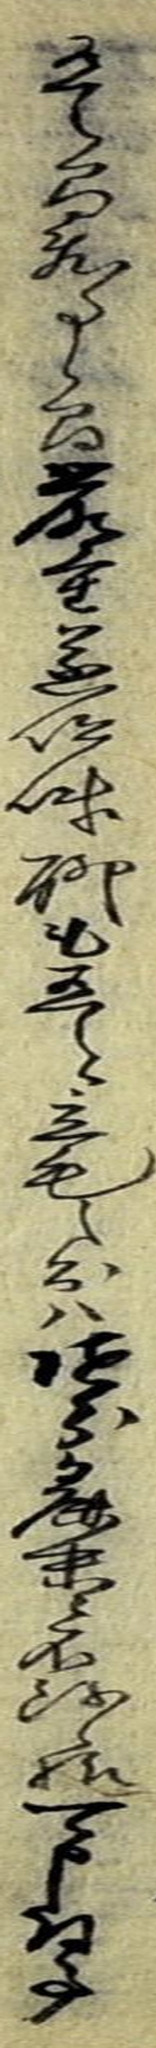有之間敷事候間厳重遂吟味聊も有之候立毛之分ハ随分麁末ニ不致候様可申付事
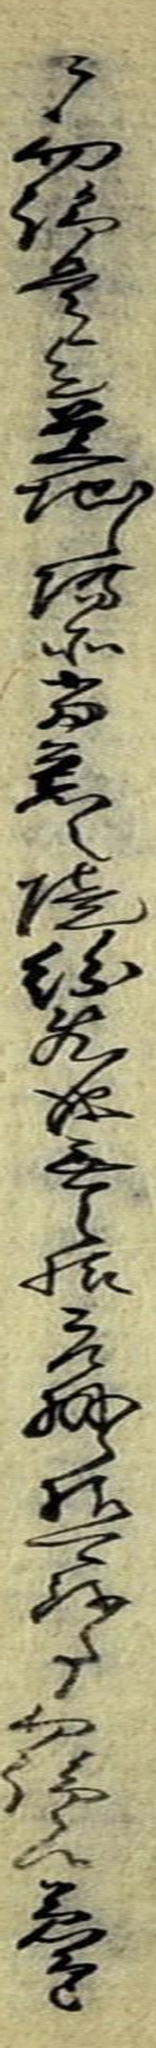ニ候勿論是迄荒地之場所当荒之境紛敷儀無之様取扱候様可致事勿論ニ候兼而被
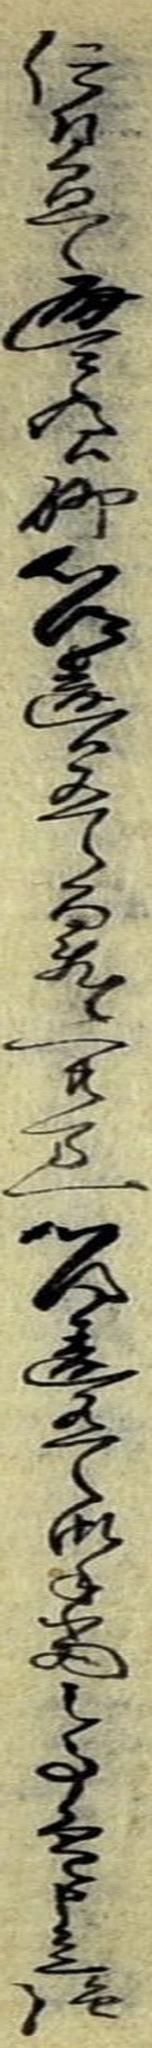仰付置候通ニ候得ハ聊心得違ハ有之間敷候へ共万一心得違有之御手当之事而已申立強
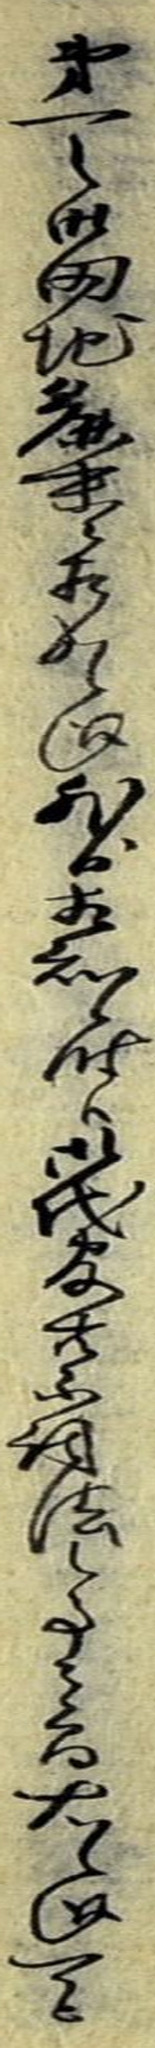第一之御田地麁末ニ相成候趣外ゟ相知候時ハ御代官共不調法之事ニ候間右之趣可被
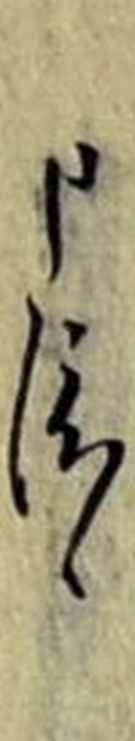申渡候
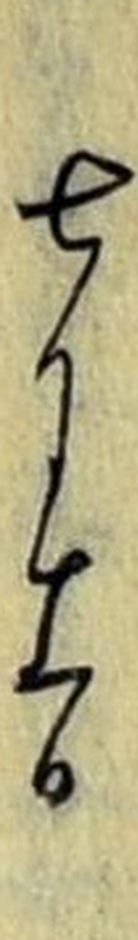七月十一日

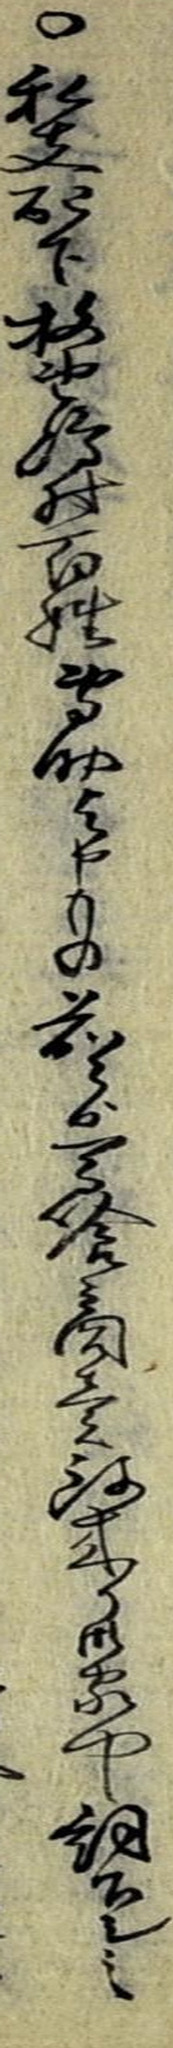〇私支配下牧野嶋村百姓専助与申もの前々ゟ馬喰商売致来り御家中下シ之
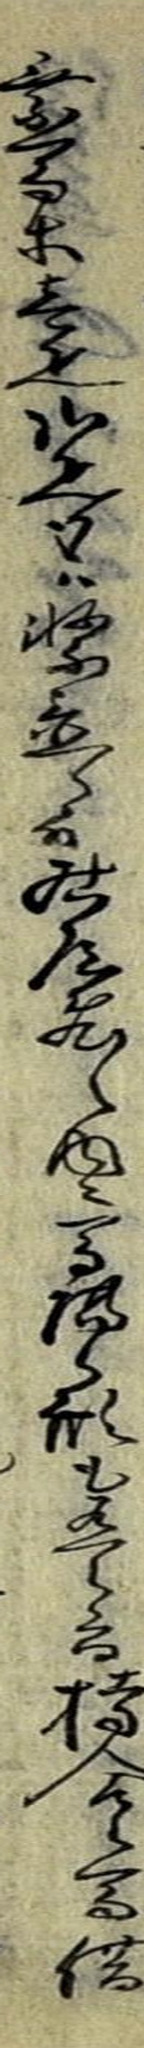乗馬等壱疋弐疋ツヽハ繋置候ニ付居屋敷之内ニ馬場之形も有之候間持合之馬借
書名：命令之部 三
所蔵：福井県文書館 Fukui Prefectural Archives
